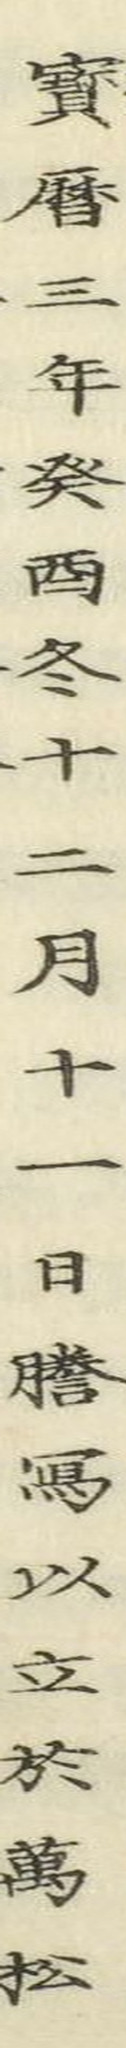寳曆三年癸酉冬十二月十一日謄冩以立於萬松
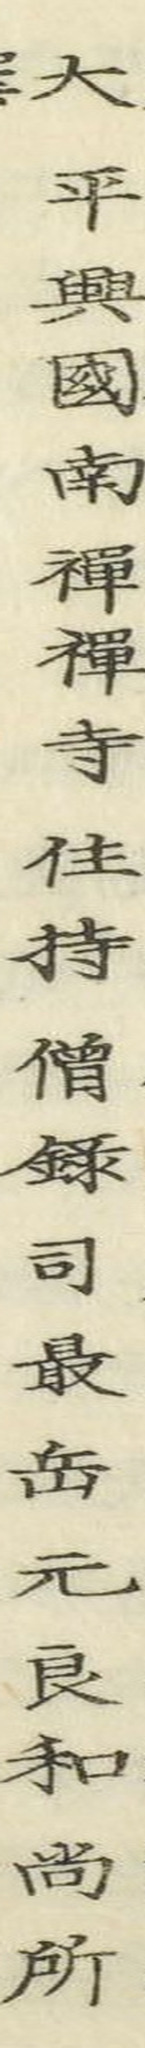大平興國南禪禪寺住持僧録司最岳元良和尚所
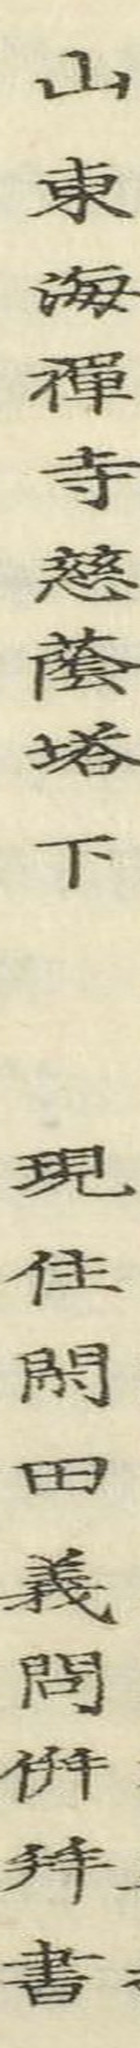山東海禪寺慈蔭塔下現住閑田義問拜書
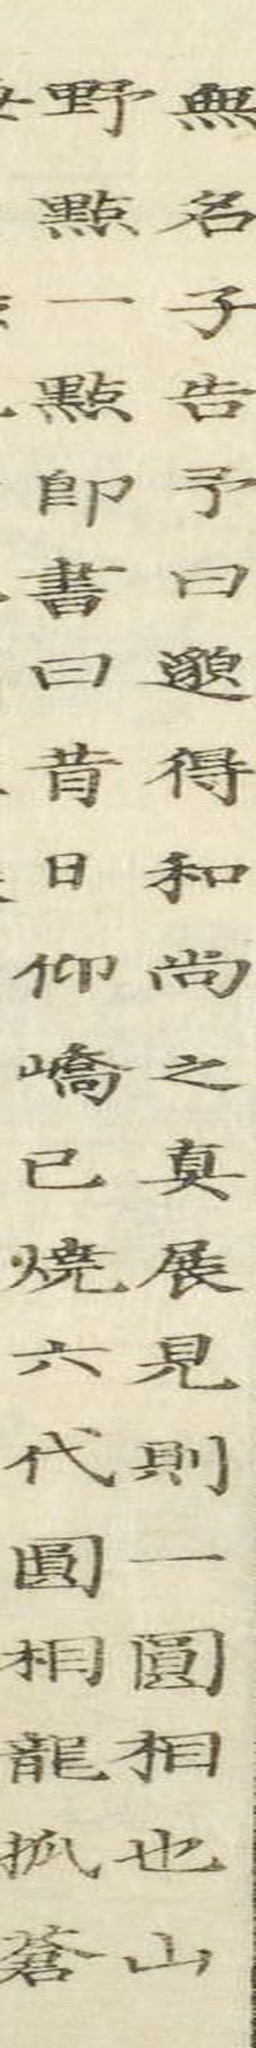野點一點卽書曰昔日仰嶠已焼六代圓相龍㧓蒼
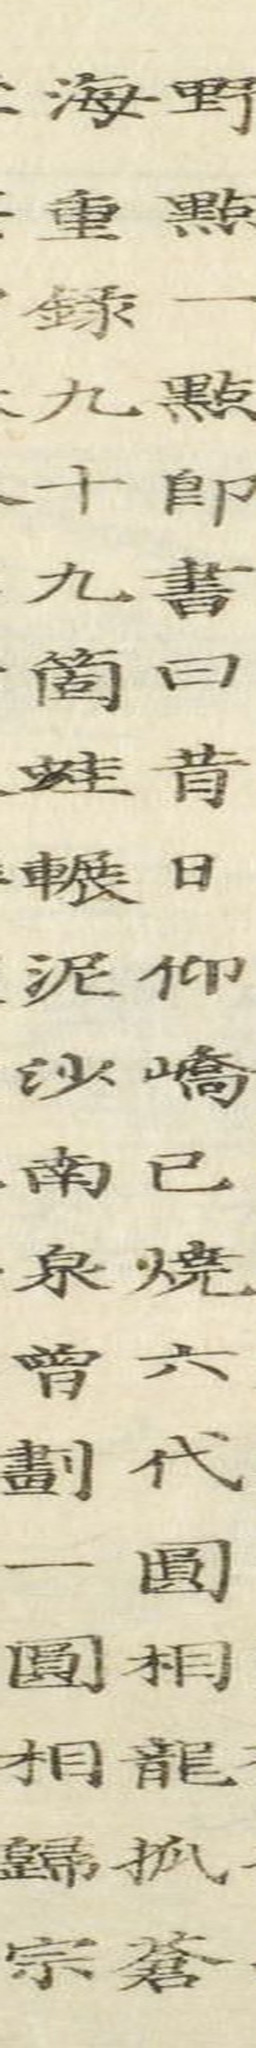海重録九十九箇蛙輾泥沙南泉曾劃一圓相歸宗
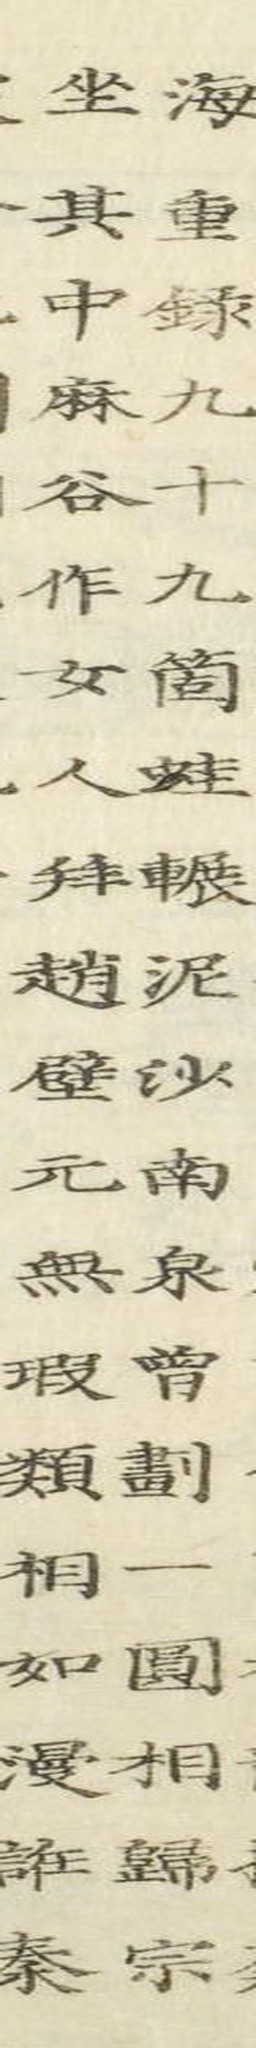坐其中麻谷作女人拜趙壁元無瑕類相如漫誰秦
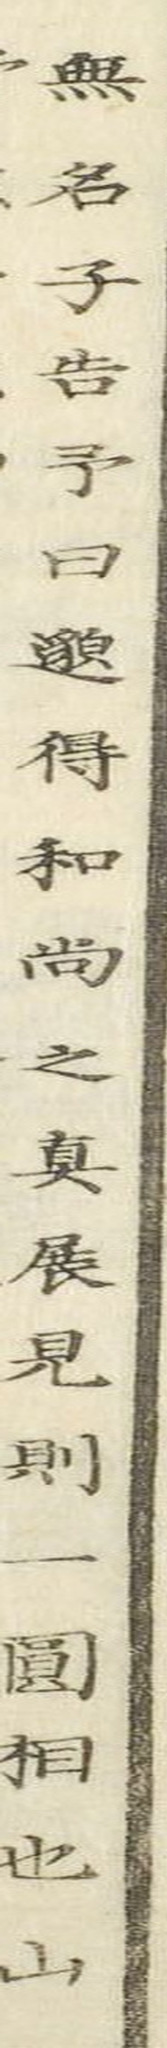無名子告予曰邈得和尚之真展見則一圓相也山
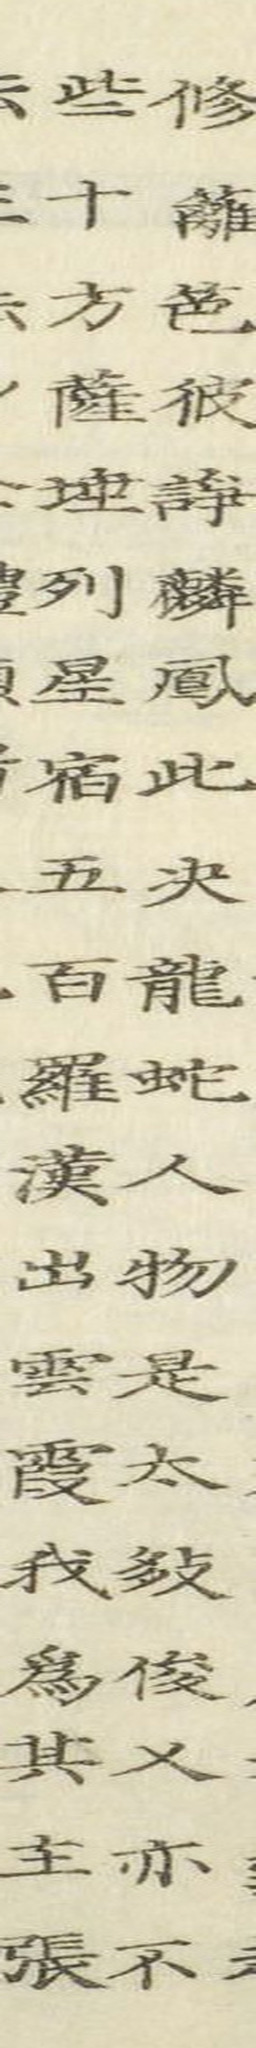些十方薩埵列星宿五百羅漢出雲霞我爲其主張
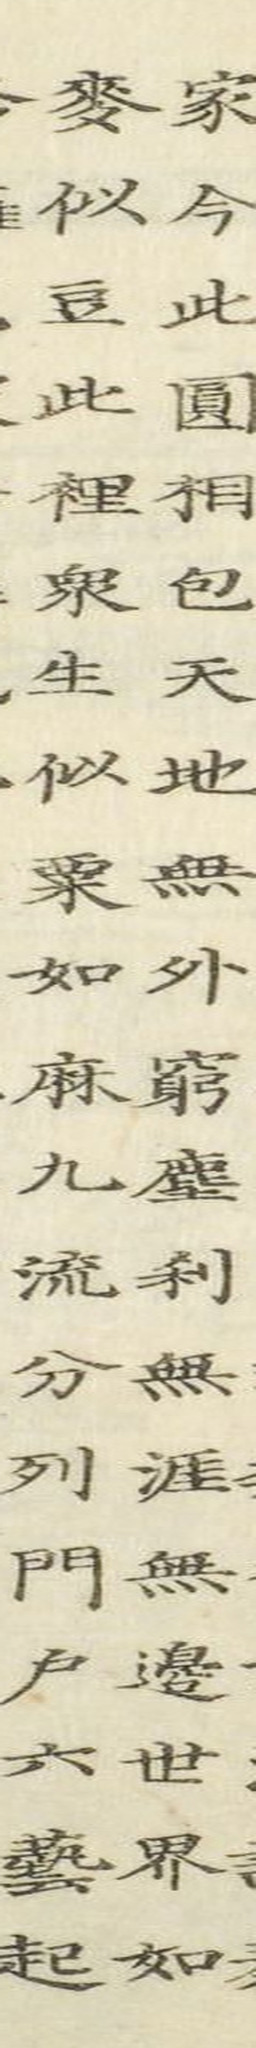麥似豆此裡衆生似粟如麻九流分列門戸六藝起
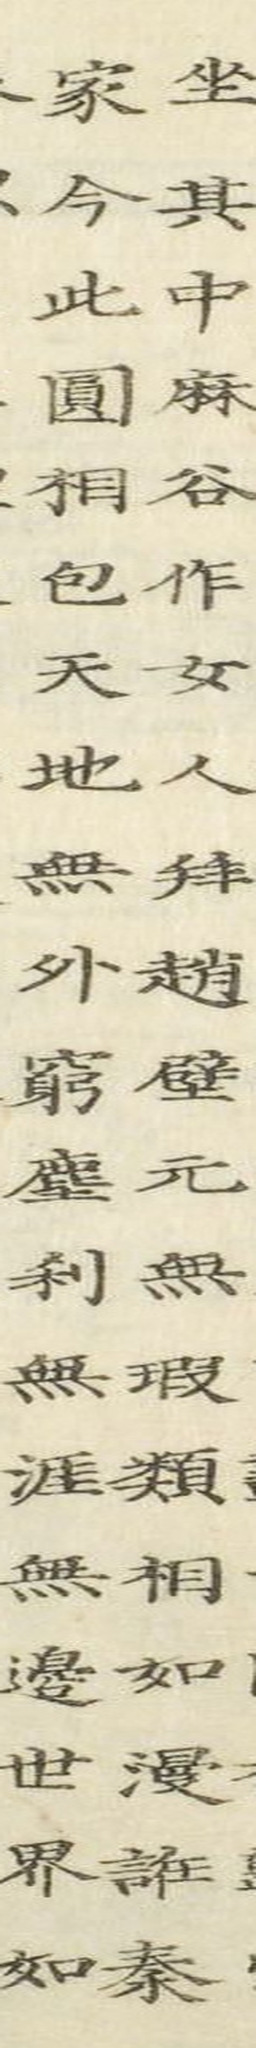家今此圓相包天地無外窮塵刹無涯無邉世界如
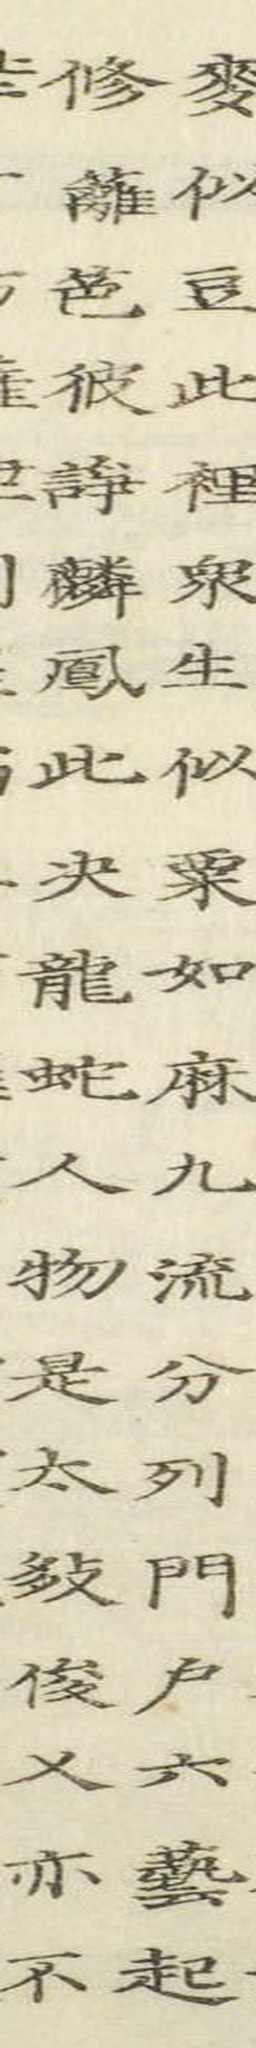修籬笆彼諍麟鳳此决龍蛇人物是太㩼俊又亦不
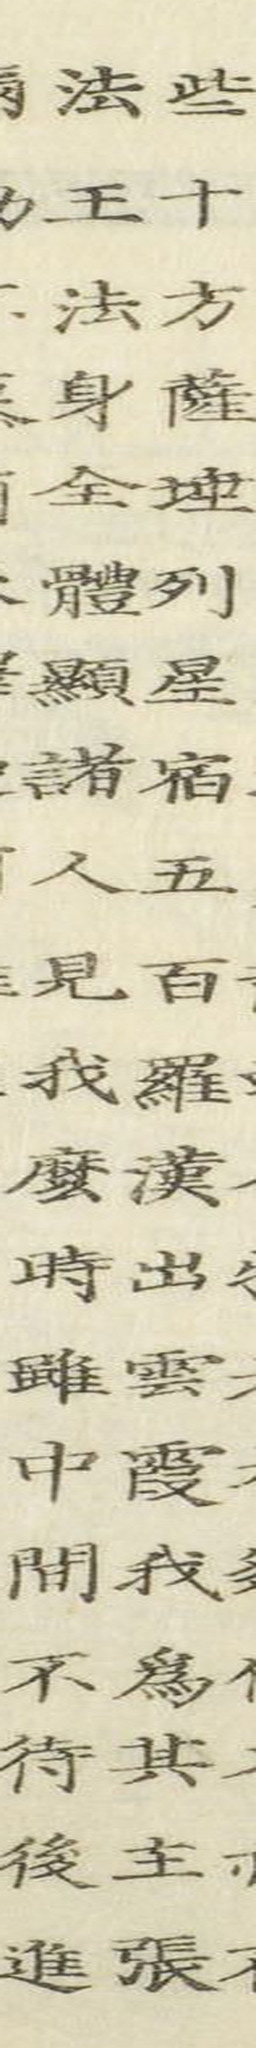法王法身全體顯諸人見我麼時雖中間不待後進
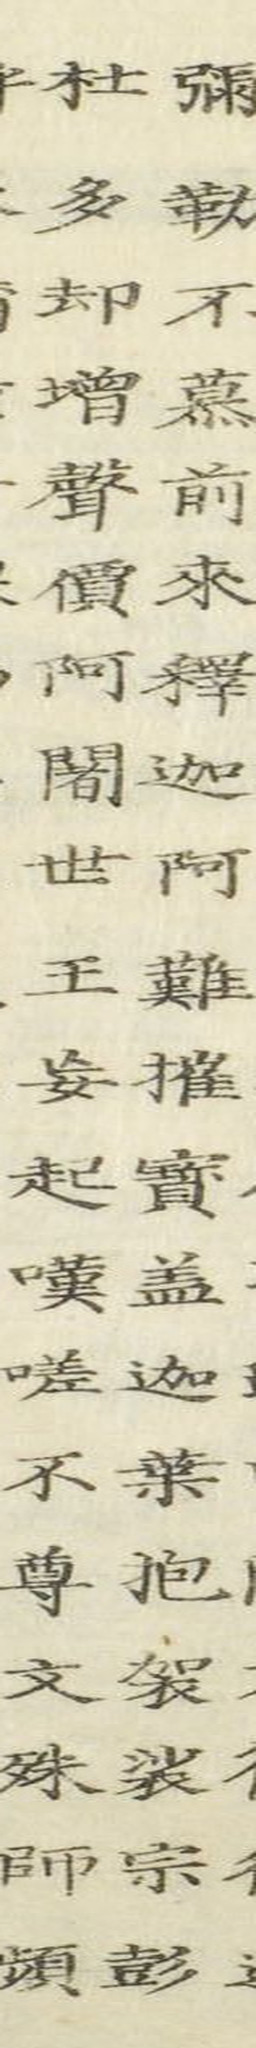杜多却增聲價阿闍世王㤀起嘆嗟不尊文殊師頻
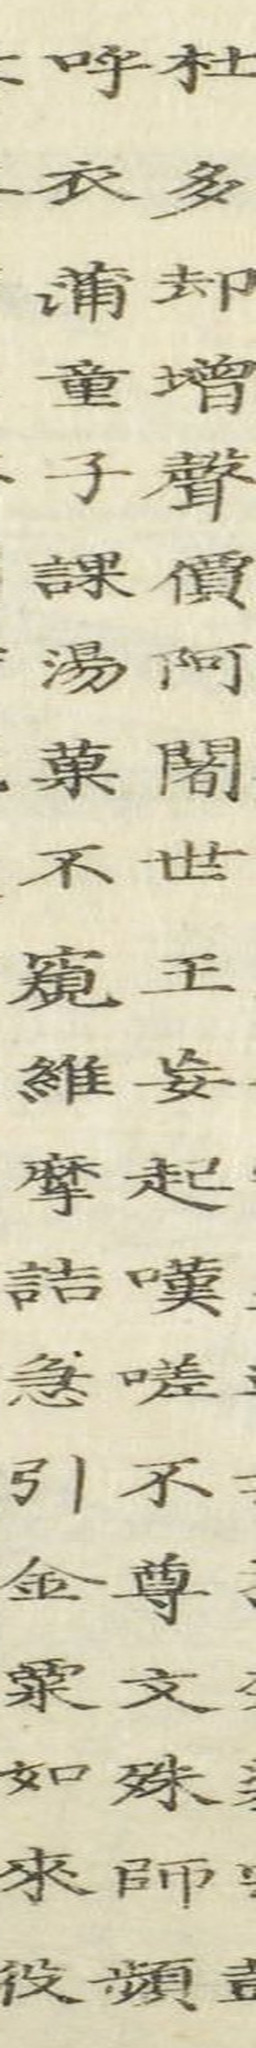呼衣蒲童子課湯菓不窺維摩詰急引金粟如來役
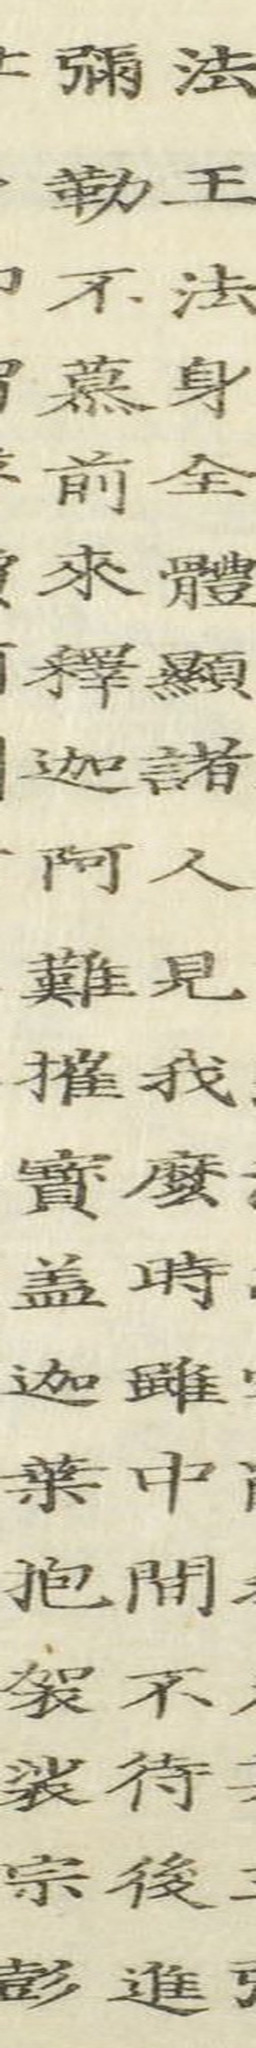彌勒不慕前來釋迦阿難摧寳盖迦葉抱袈裟宗彭
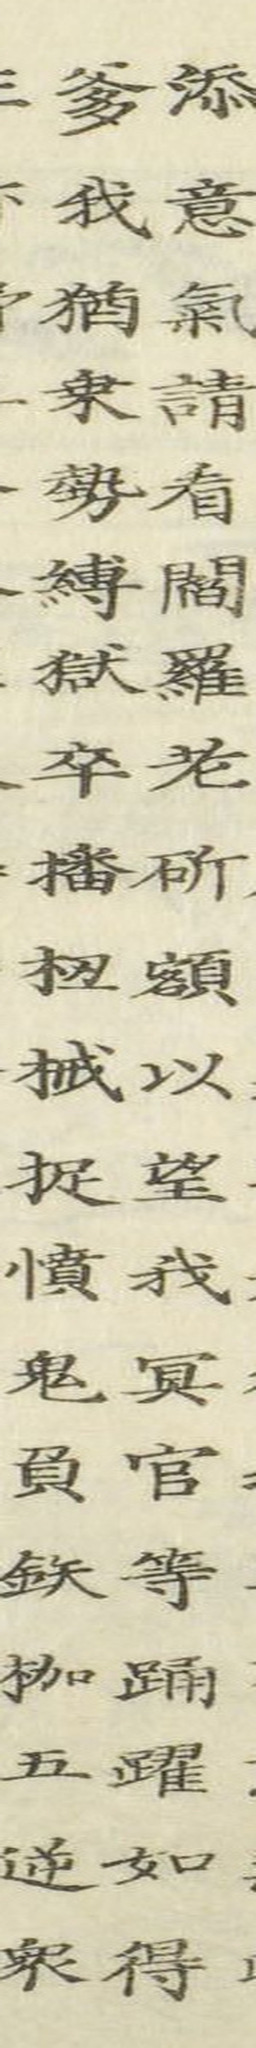爹我猶乗勢縛獄卒播𫞈械捉憤鬼負鉄枷五逆衆
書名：江戸名所図会 20巻 巻之4
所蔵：東京学芸大学教育コンテンツアーカイブ
